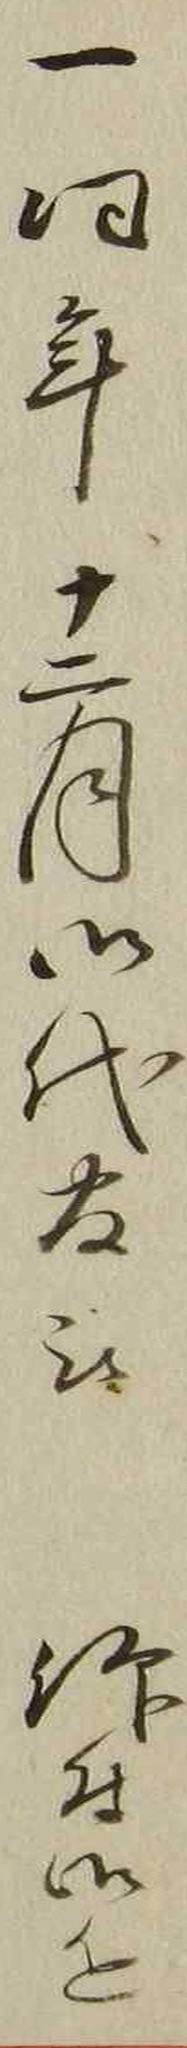一同年十二月御代官被仰付御近
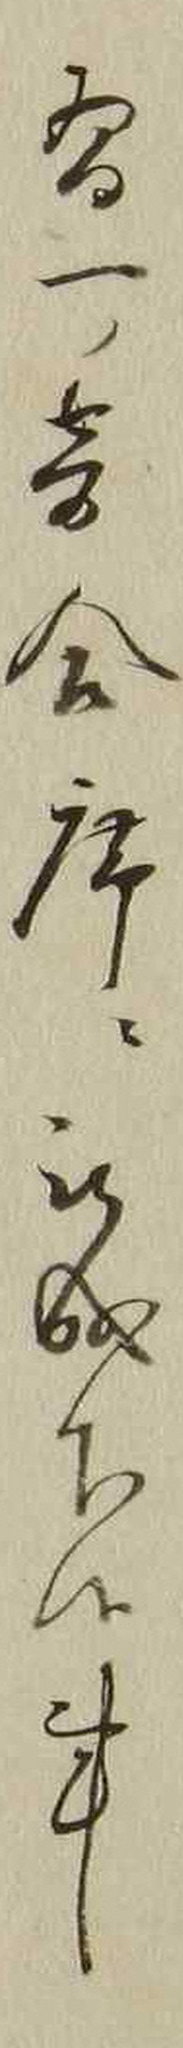習一ノ寄合席ニ被成下候事
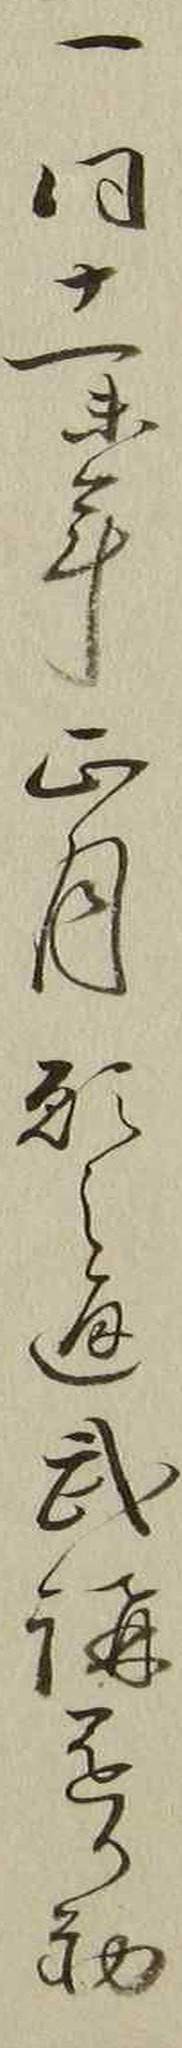一同十一未年正月願之通武講懸り勤
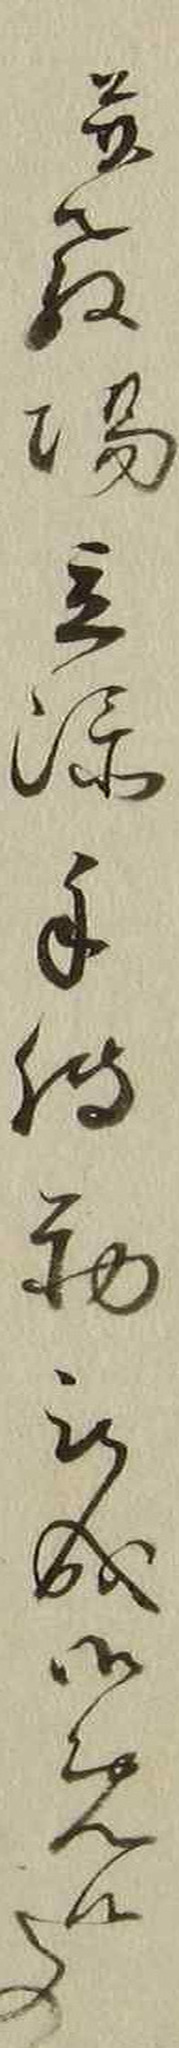幷教場立添手伝勤被成御免候事
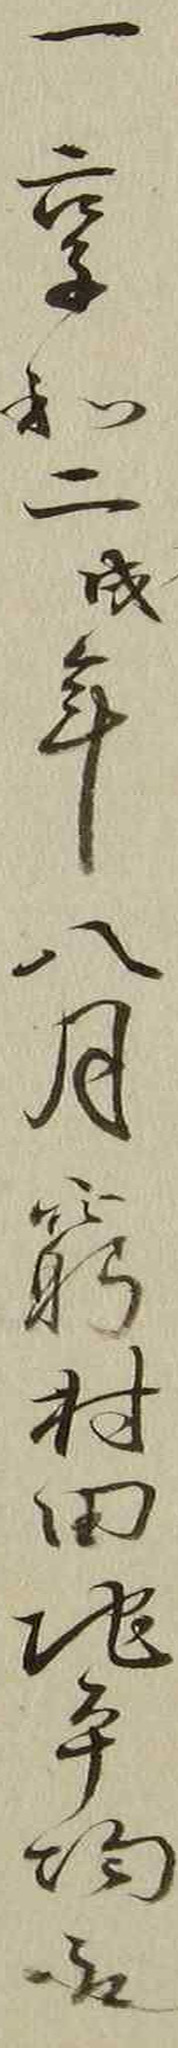一享和二戌年八月窮村田地平均取
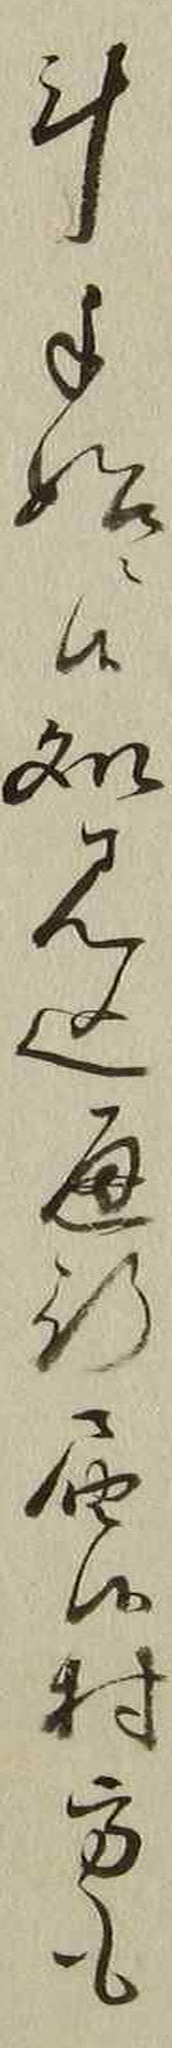計手始ニ候処見込通行届候村方も
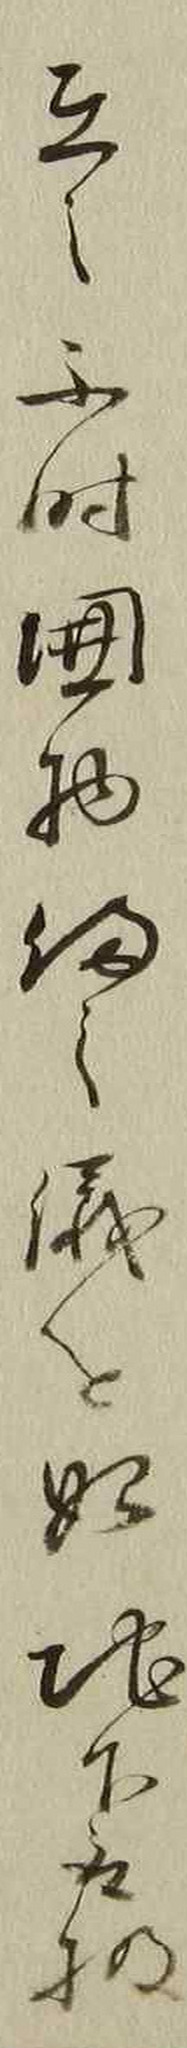在之不時囲物備之儀を始地下取扱
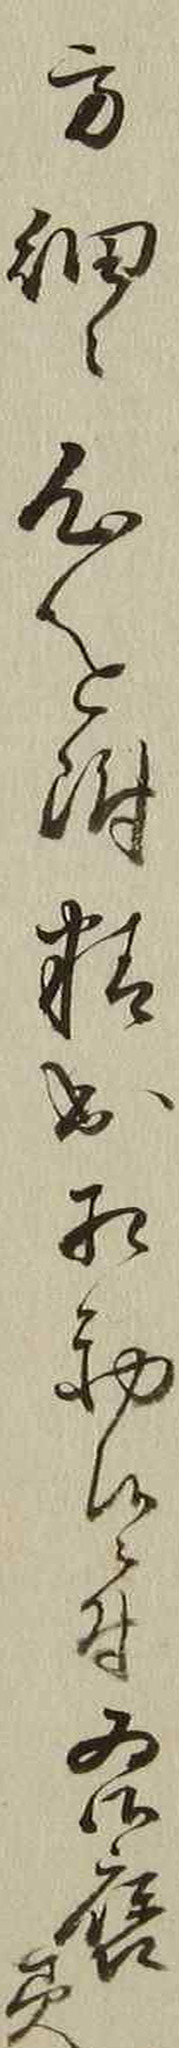方細々心を附精出勤候ニ付為御褒美
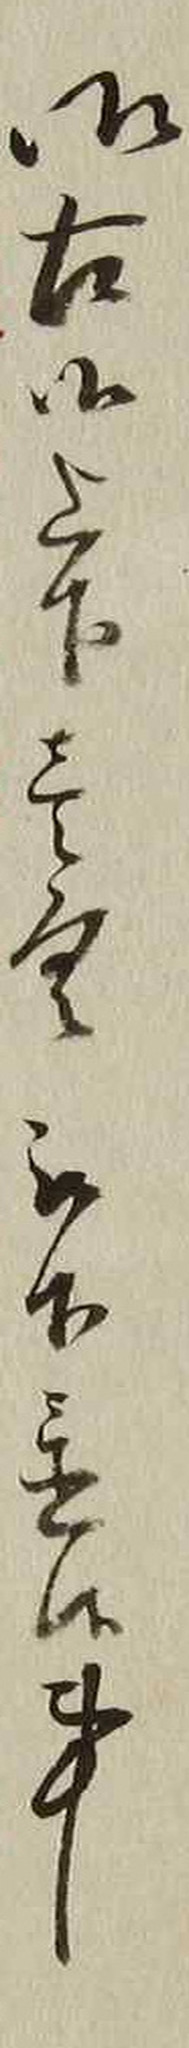御古御上下壱具被下置候事
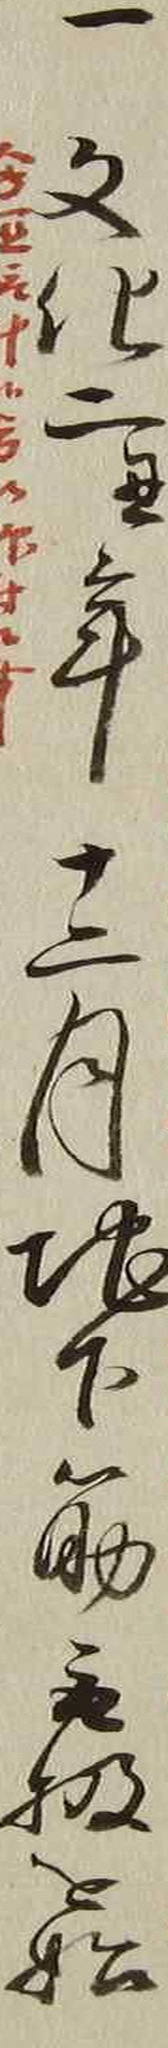一文化二丑年十二月地下筋取扱を始
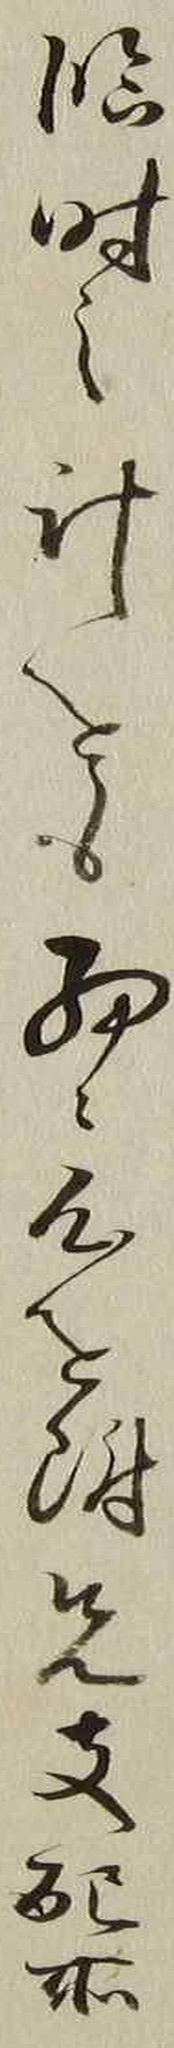臨時之計をも細々心を附先支配所
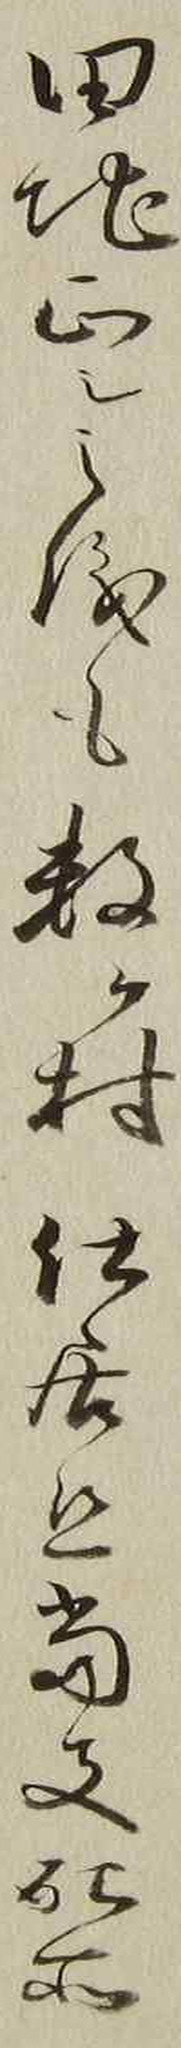田地正し之儀も数ヶ村仕居且当支配所
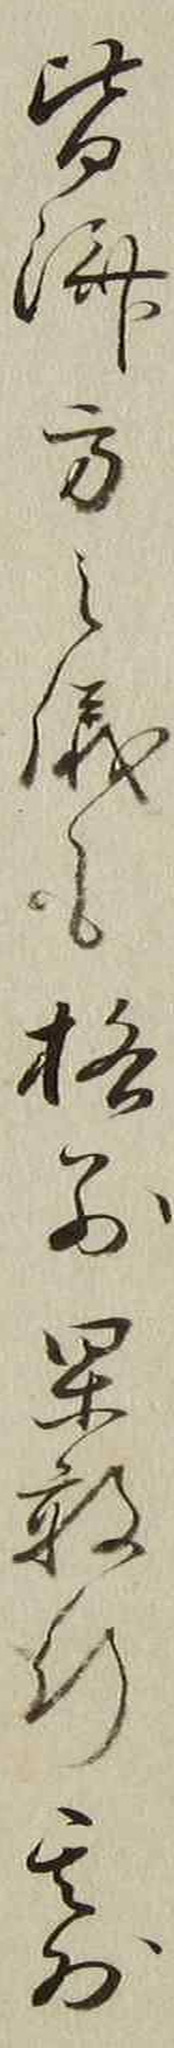皆済方之儀も格別果敢行其外
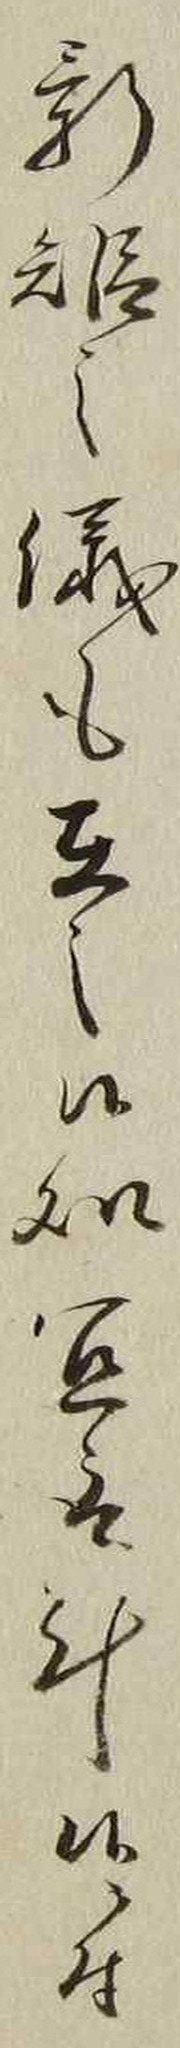新矩之儀も在之候処宜取計候ニ付
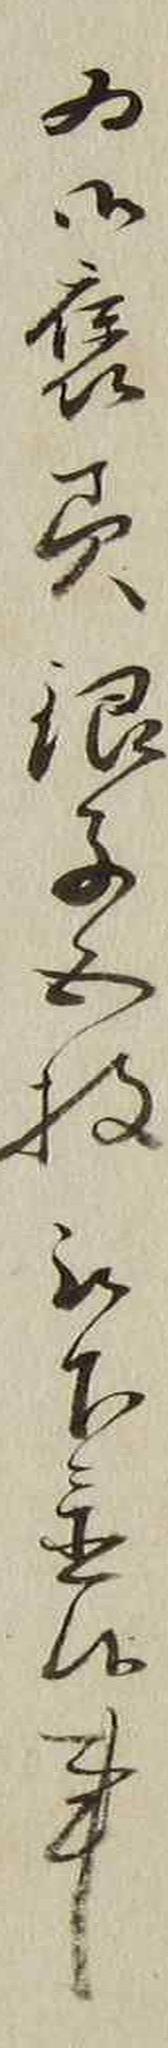為御褒美銀子五枚被下置候事
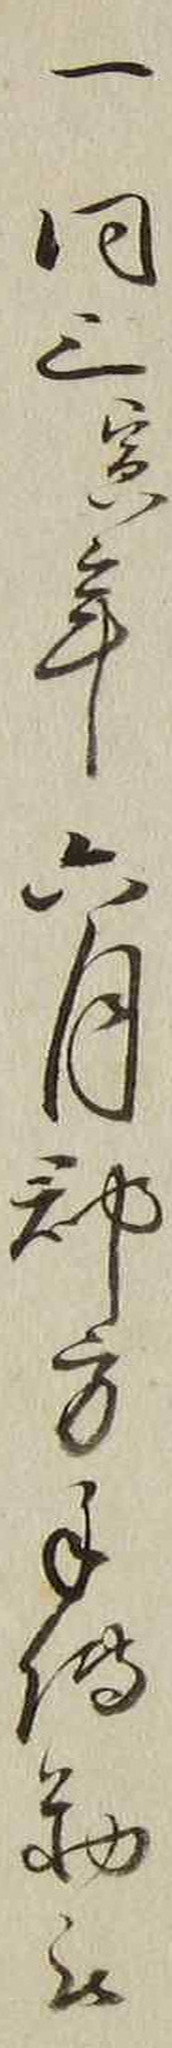一同三寅年六月郡方手伝勤被
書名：諸士系譜　巻之52　に之部3
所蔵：会津若松市立会津図書館
